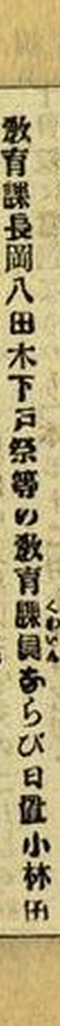教育課長岡八田木下戸祭等の教育課員ならび日置小林田
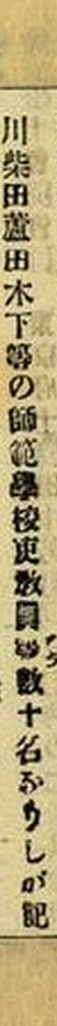川柴田蘆田木下等の師範学校吏教員等数十名なりしが記
